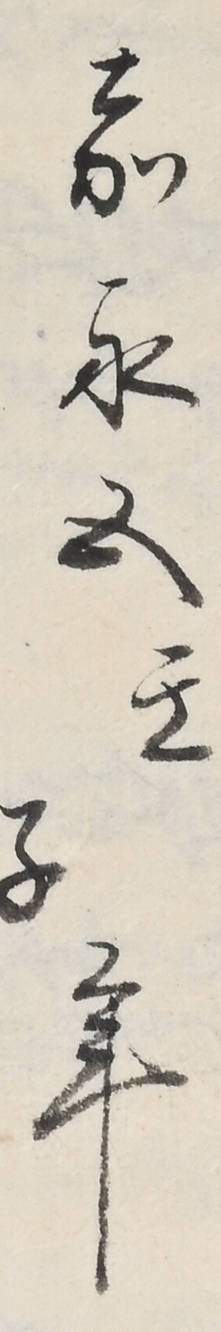嘉永五壬子年
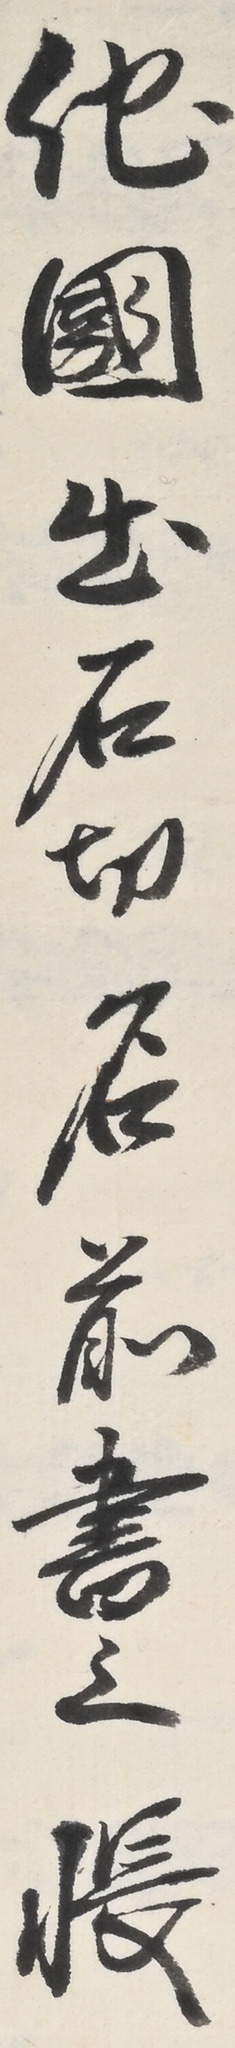他国出石切名前書上帳
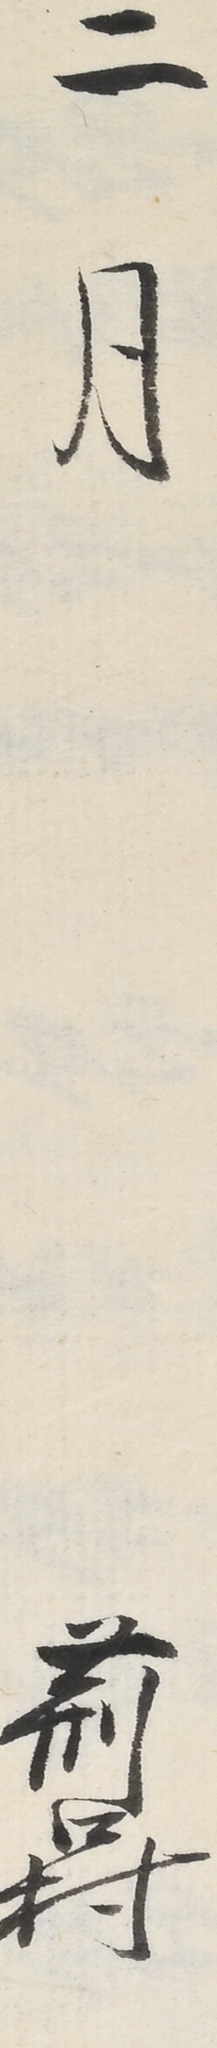二月荊口村

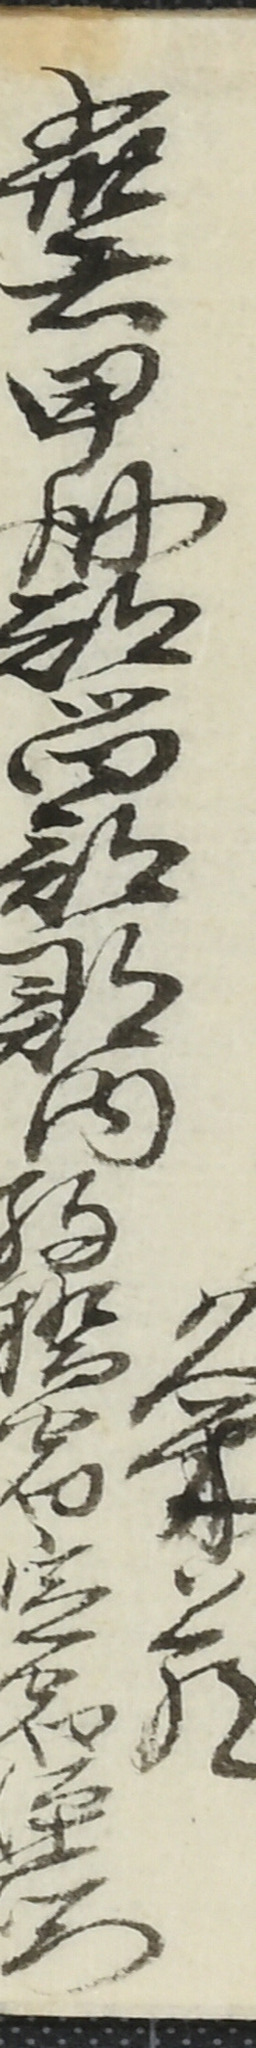此者甲州都留郡郡内駒橋宿定宿源右衛門

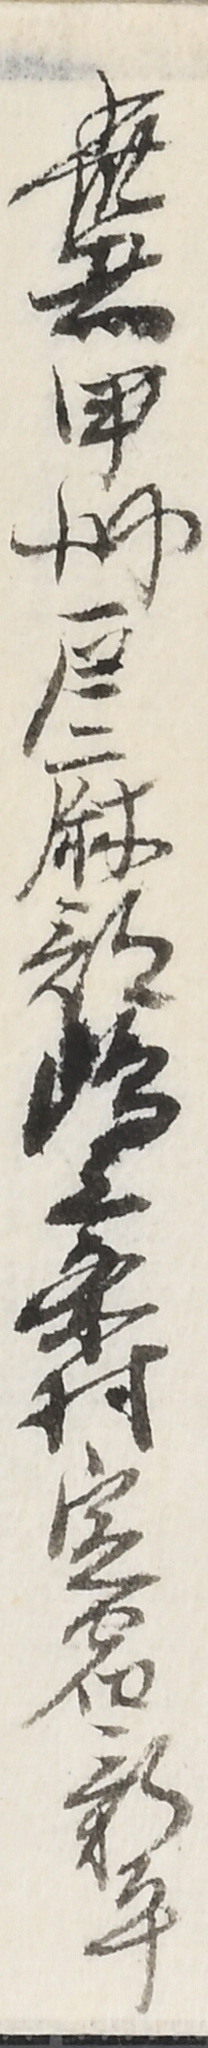此者甲州巨摩郡島上条村定宿新平
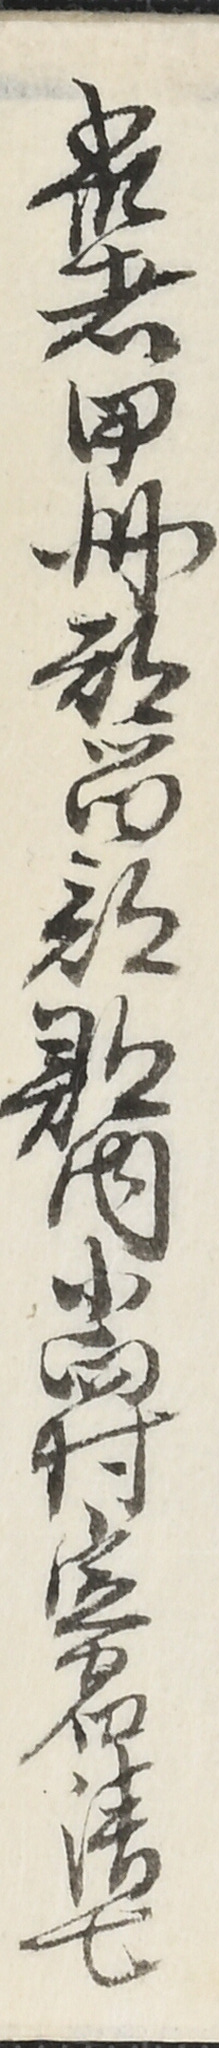此者甲州都留郡郡内小向村定宿清七
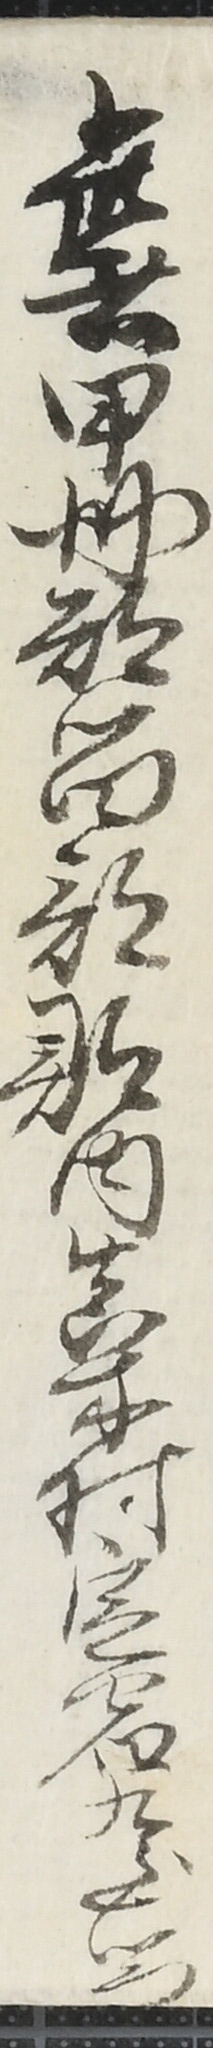此者甲州都留郡郡内真木村定宿九郎右衛門

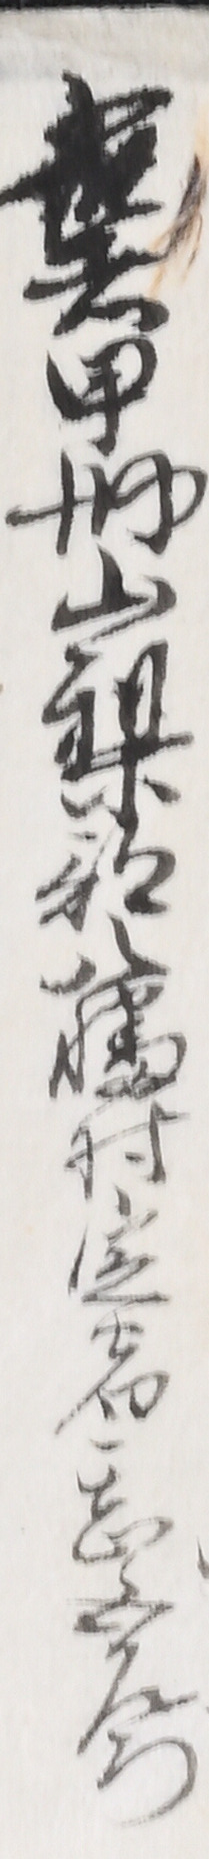此者甲州山梨郡八幡村定宿甚五左衛門
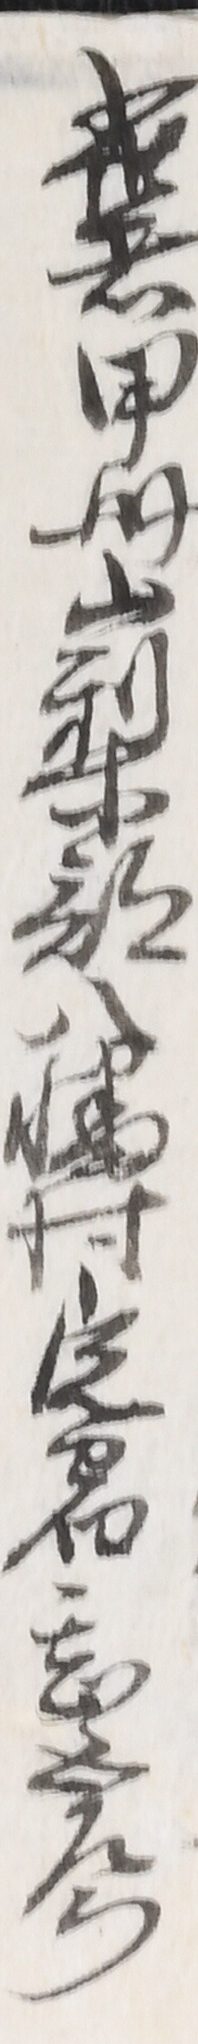此者甲州山梨郡八幡村定宿甚五左衛門
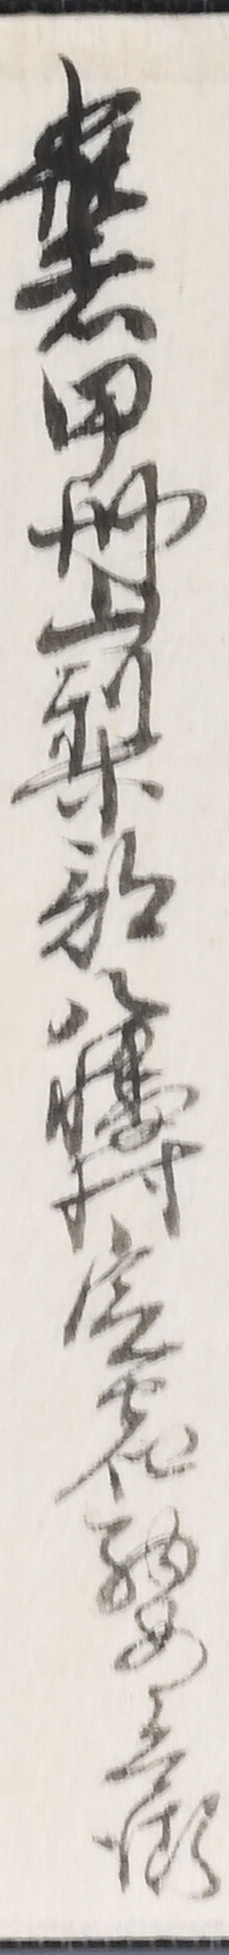此者甲州山梨郡八幡村定宿要兵衛
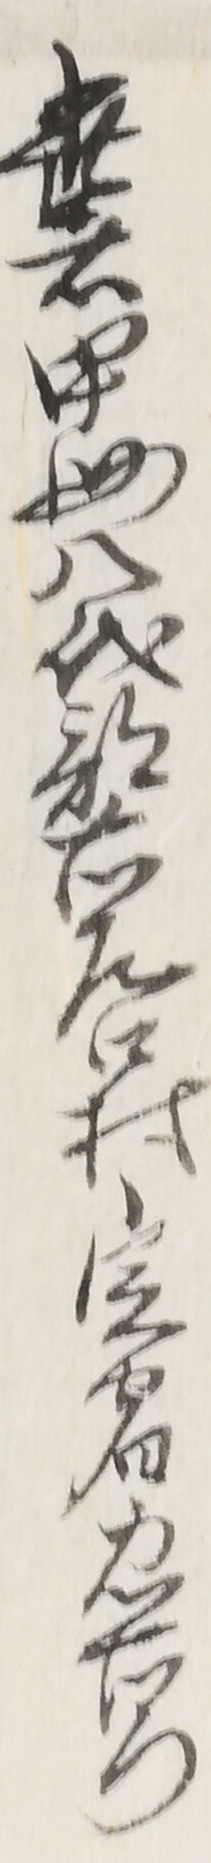此者甲州八代郡右左口村定宿忠右衛門
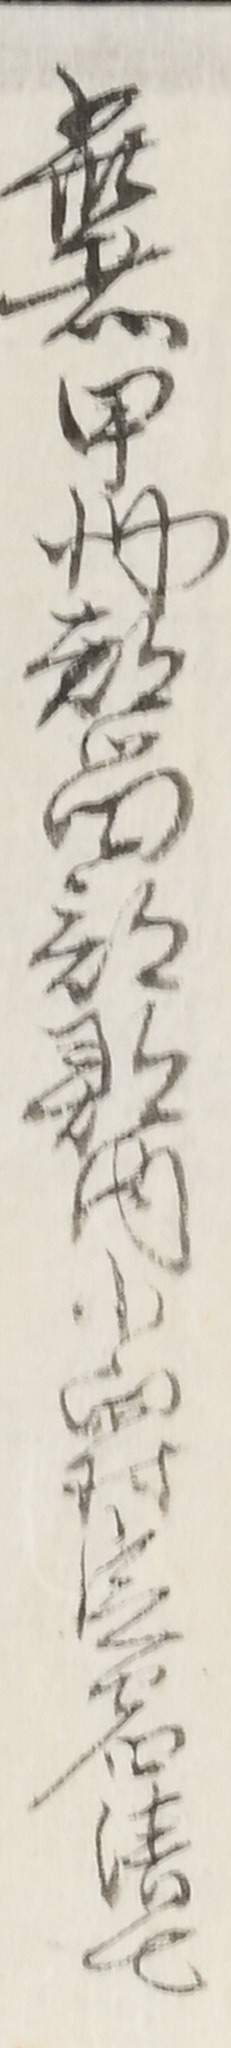此者甲州都留郡郡内小向村定宿清七
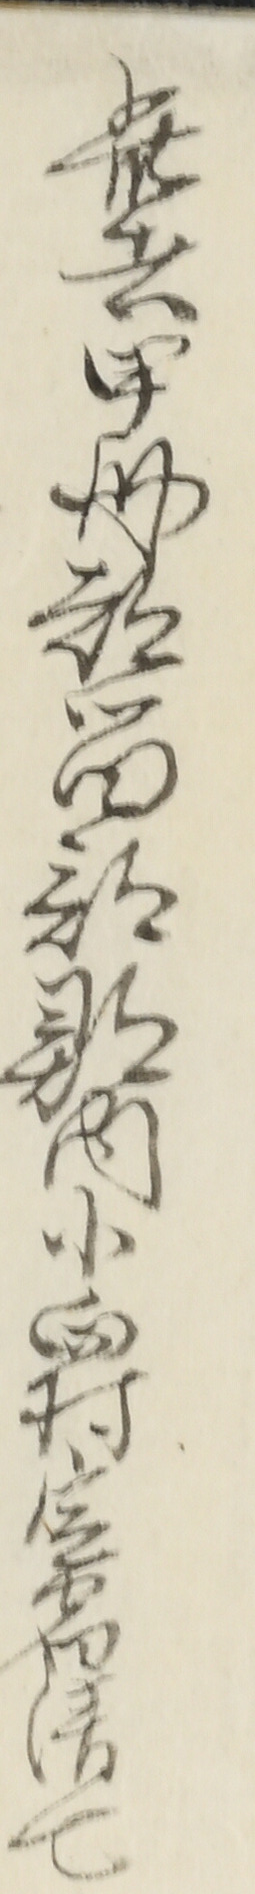此者甲州都留郡郡内小向村定宿清七
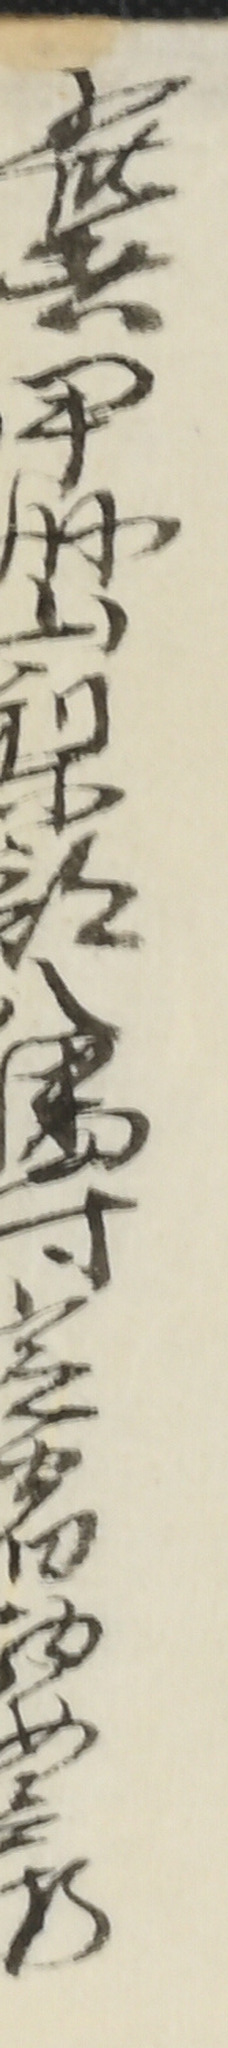此者甲州山梨郡八幡村定宿要兵衛

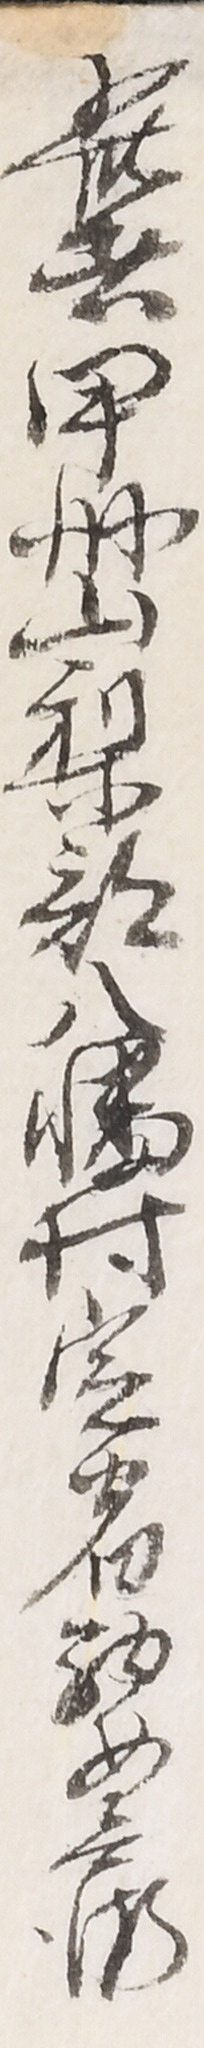此者甲州山梨郡八幡村定宿甚五左衛門
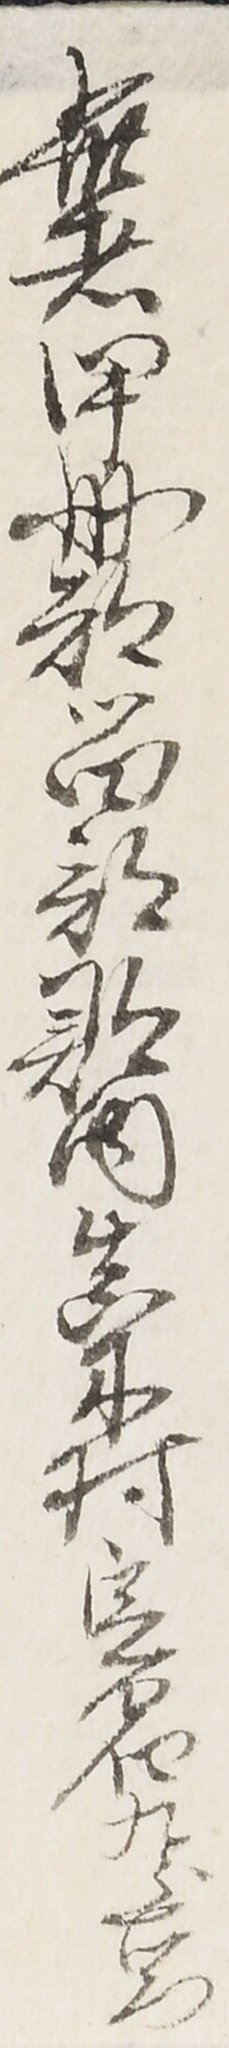此者甲州都留郡郡内真木村定宿九郎右衛門
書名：嘉永五壬子年二月他國出石切名前書上帳
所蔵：伊那市立高遠町図書館・合同会社AMANE
